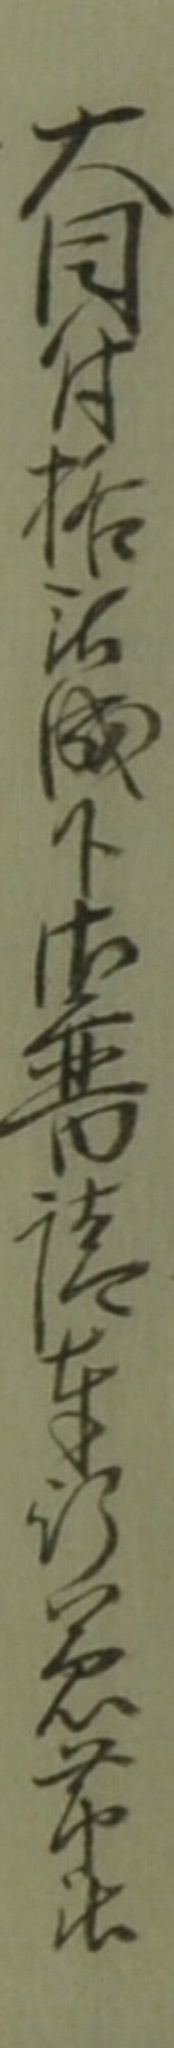大目付格被成下御普請奉行兼帯被

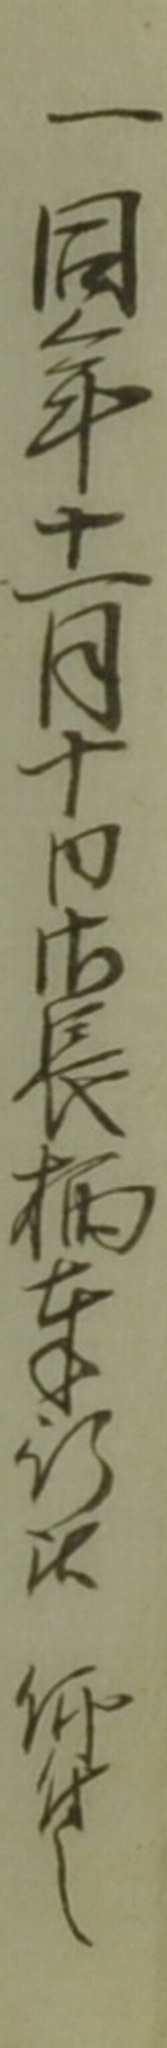一同年十一月十日御長柄奉行役被仰付之
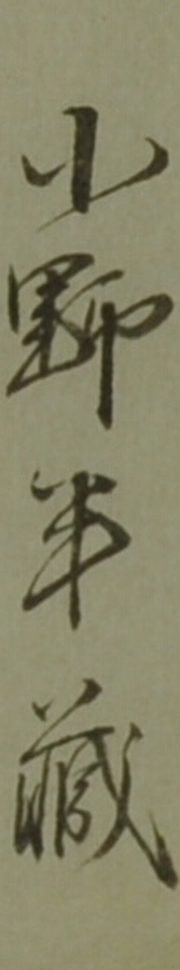小野半蔵
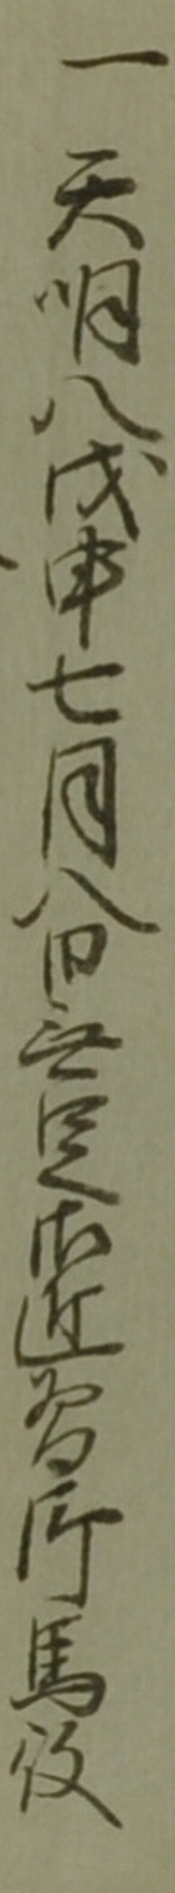一天明八戊申七月八日無足御近習御馬役
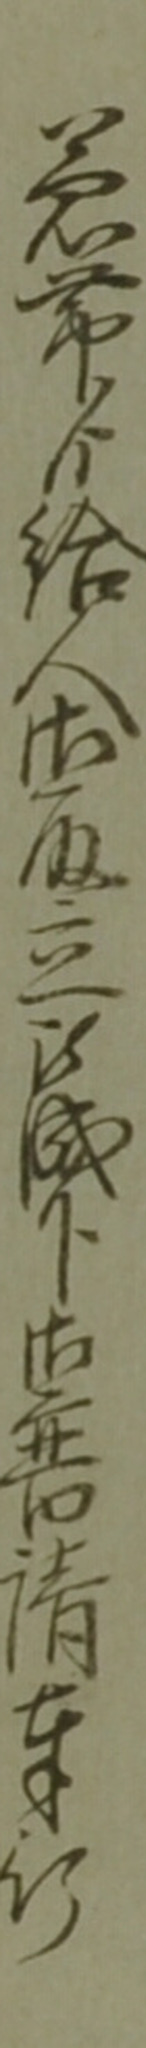兼帯ゟ給人御取立被成下御普請奉行
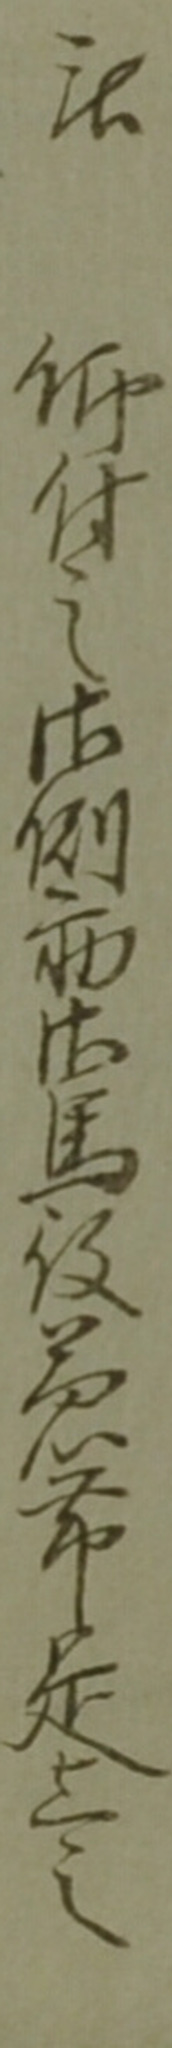被仰付之御側勤御馬役兼帯是迄之
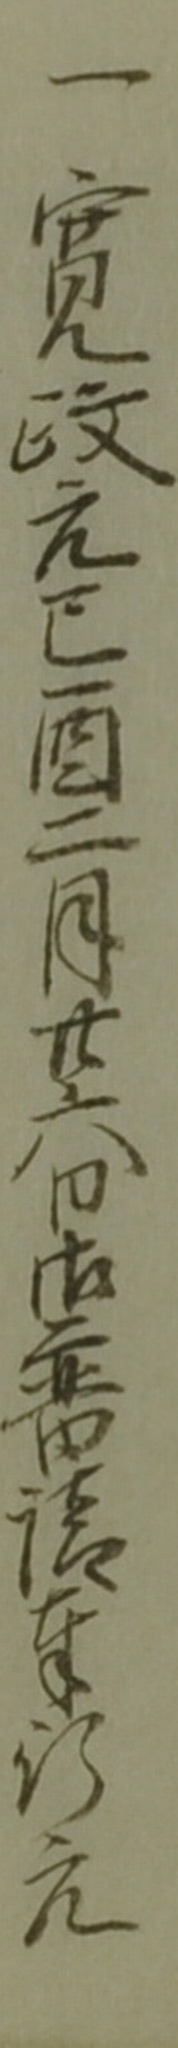一寛政元己酉二月廿六日御普請奉行元
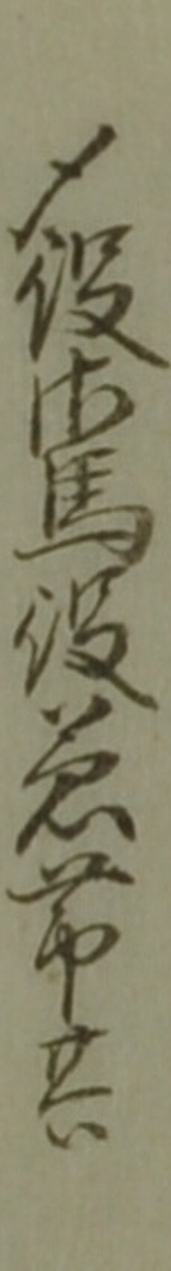〆役御馬役兼帯共
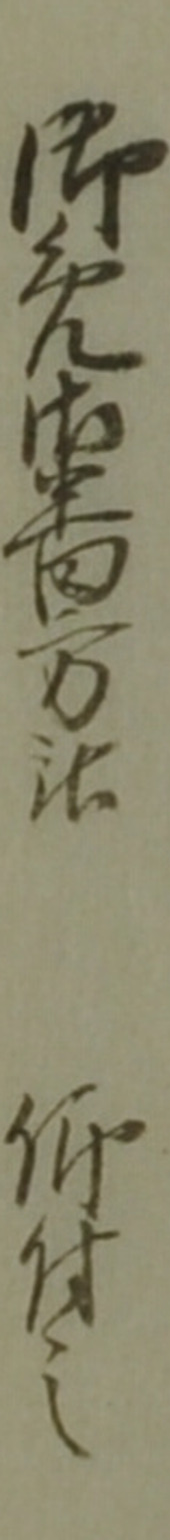御免御番方被仰付之
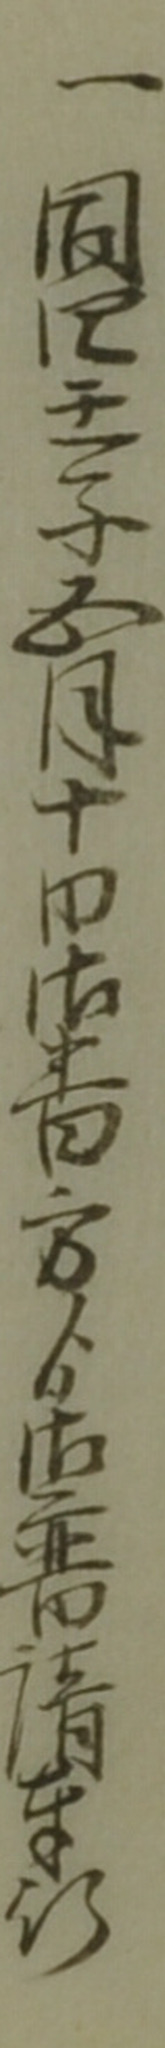一同四壬子五月十日御番方ゟ御普請奉行
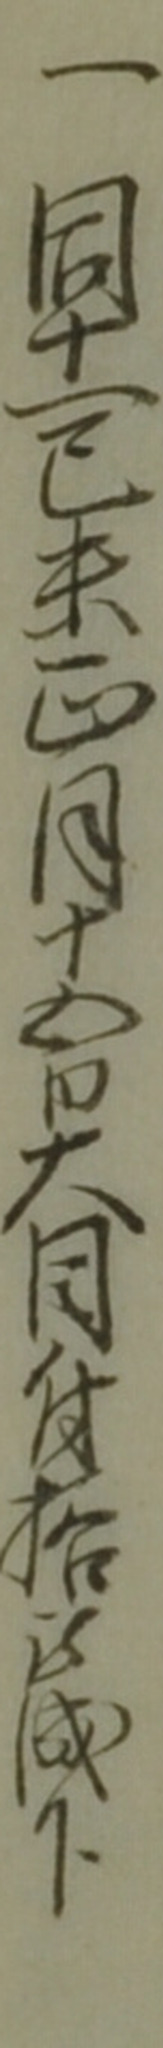一同十一己未正月十五日大目付格被成下
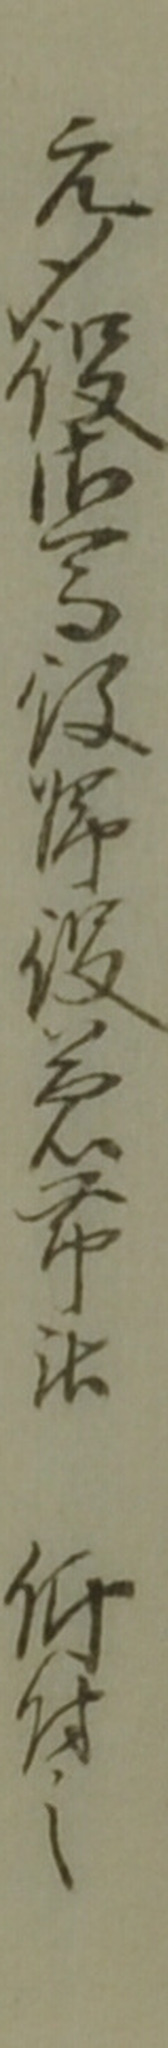元〆役御馬役帰役兼帯被仰付之
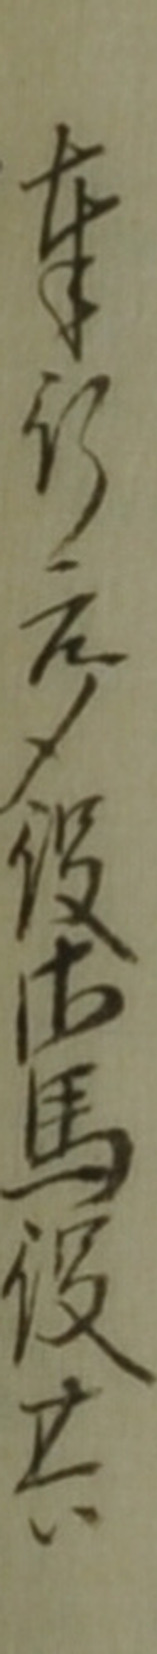奉行元〆役御馬役共
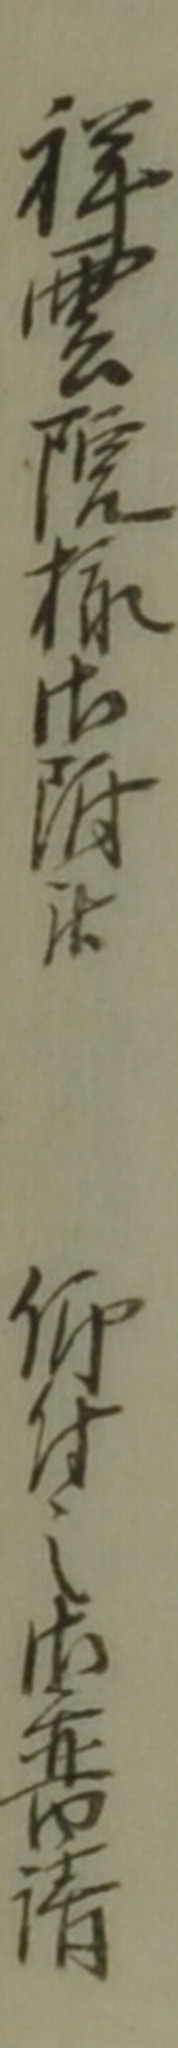祥雲院様御附被仰付之御普請
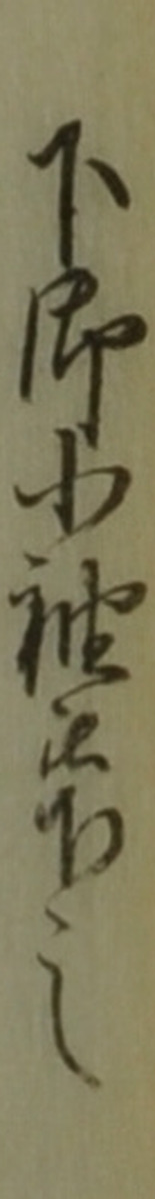下御小袖被下之
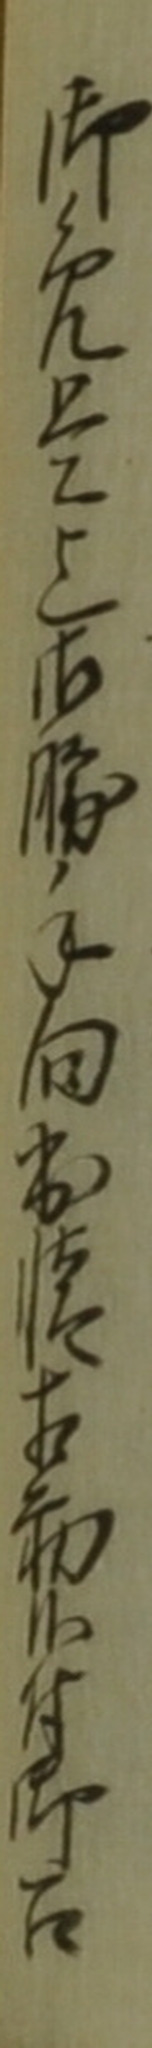御免是迄迄御勝手向◻︎慎相勤候付御召
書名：諸御役代々録（六）
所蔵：伊那市立高遠町図書館・合同会社AMANE
